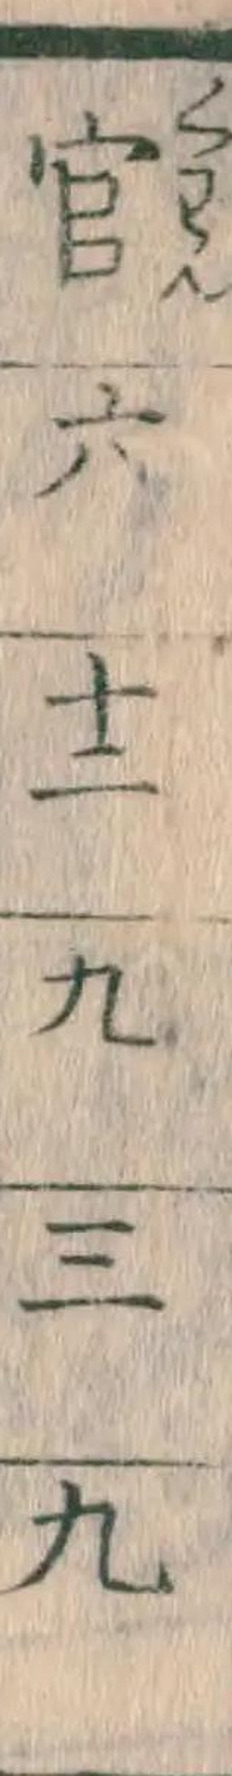官六十二九三九
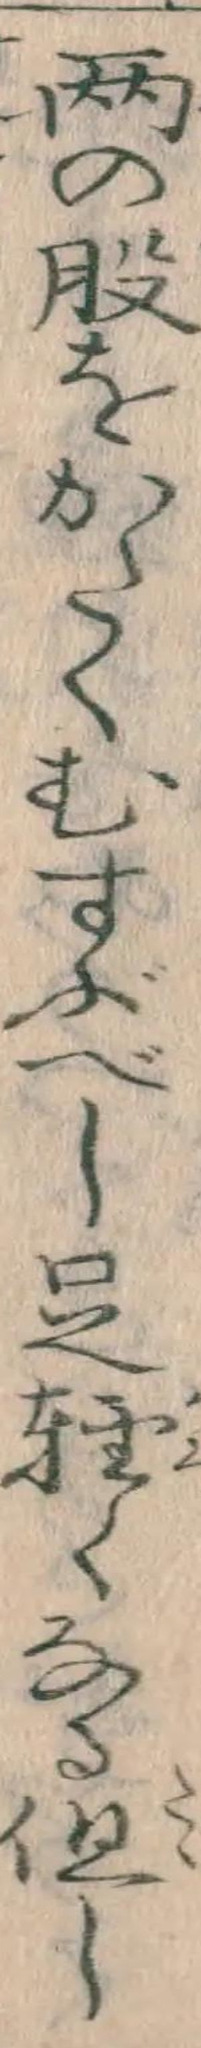両の股をかたくむすぶべし足軽くなる但し
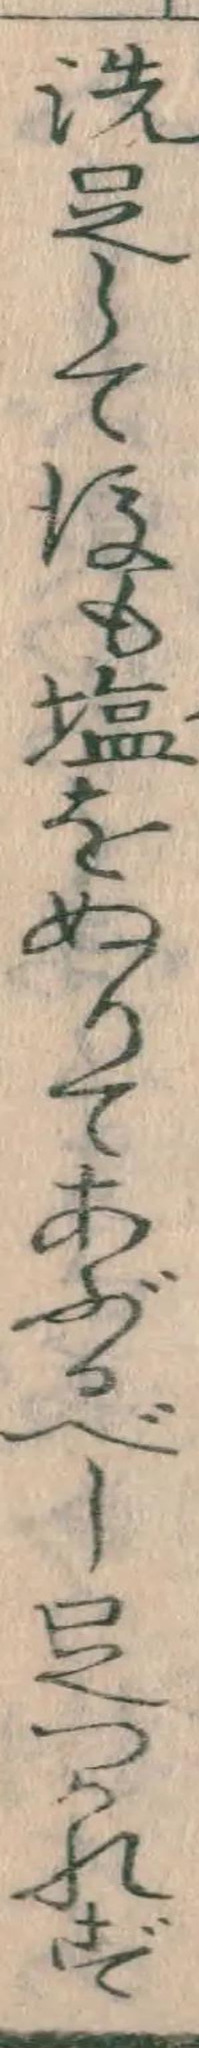洗足して後も塩をぬりてあぶるべし足つかれず
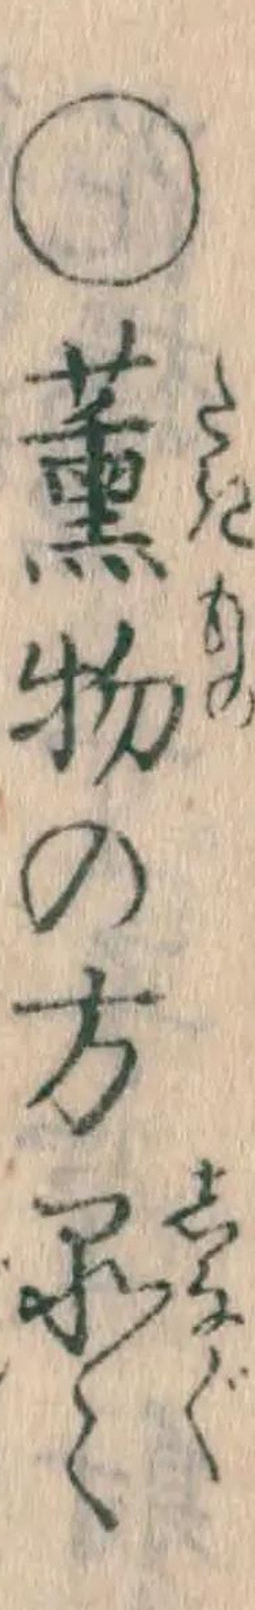○薫物の方品々
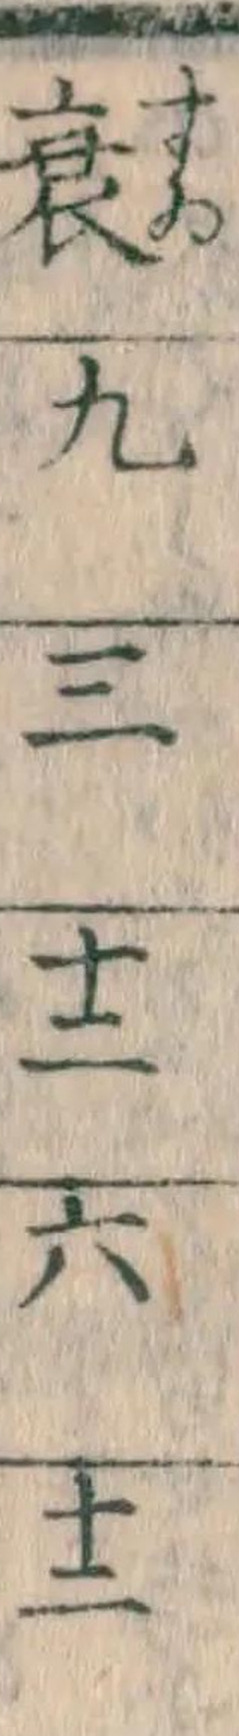衰九三十二六十二
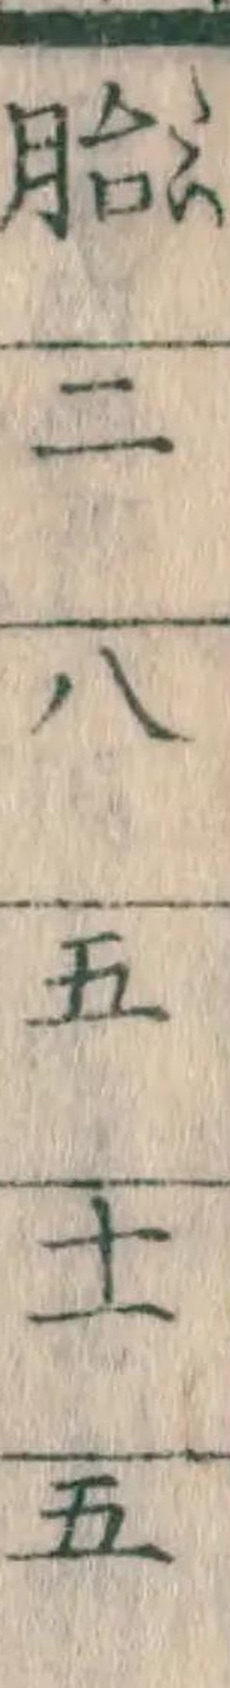胎二八五十一五
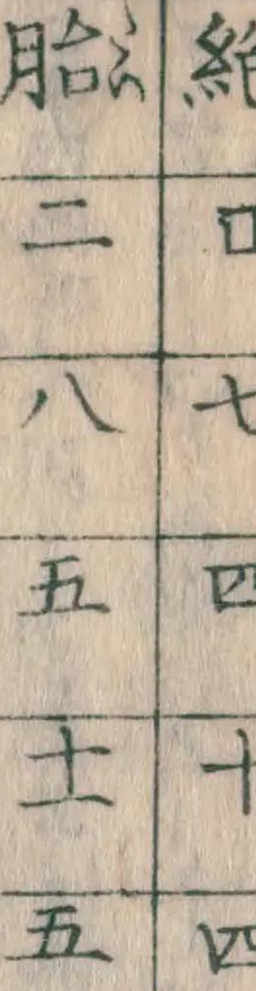胎二八五十一五
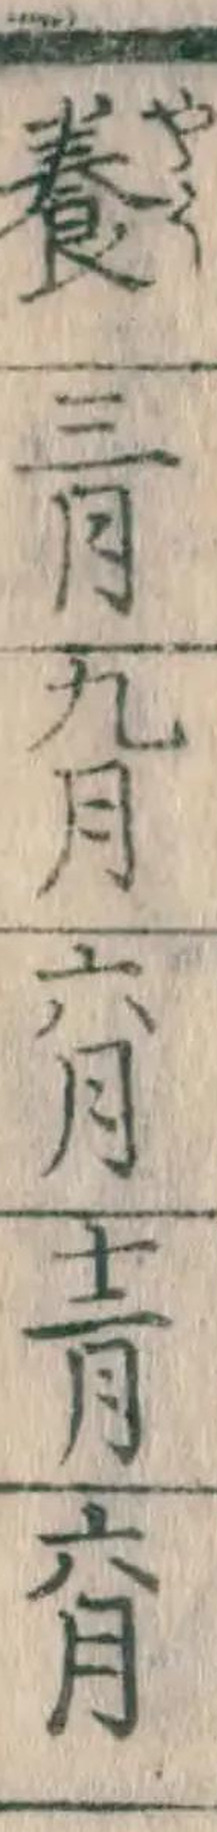養三月九月六月十二月六月
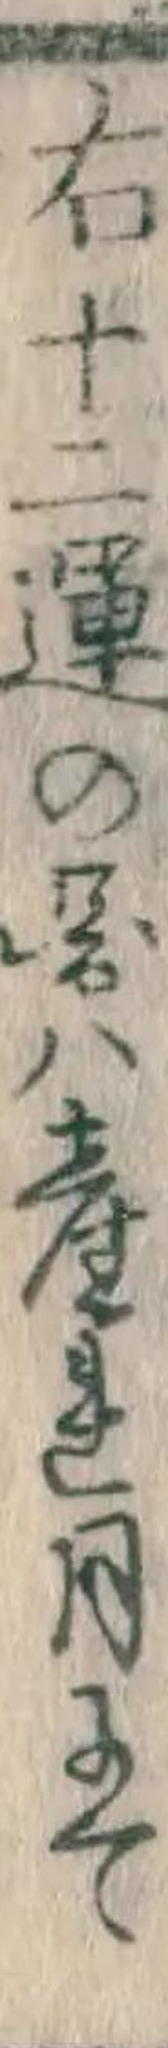右十二運の図は産れ月にて
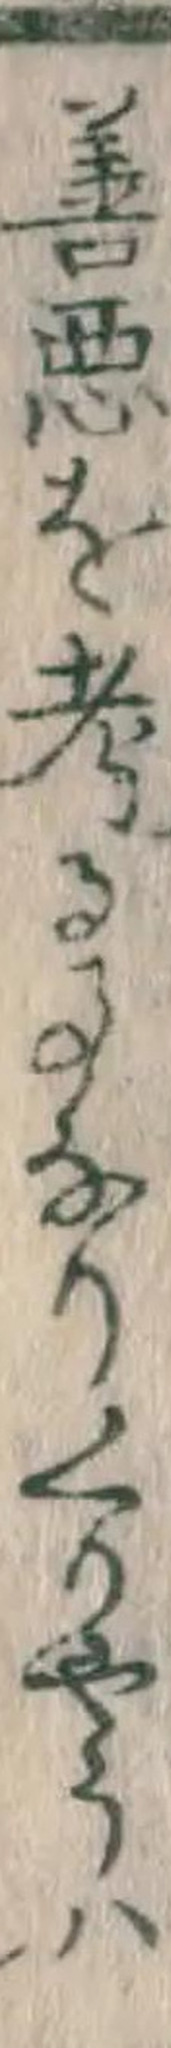善悪を考る事なりくりやうは
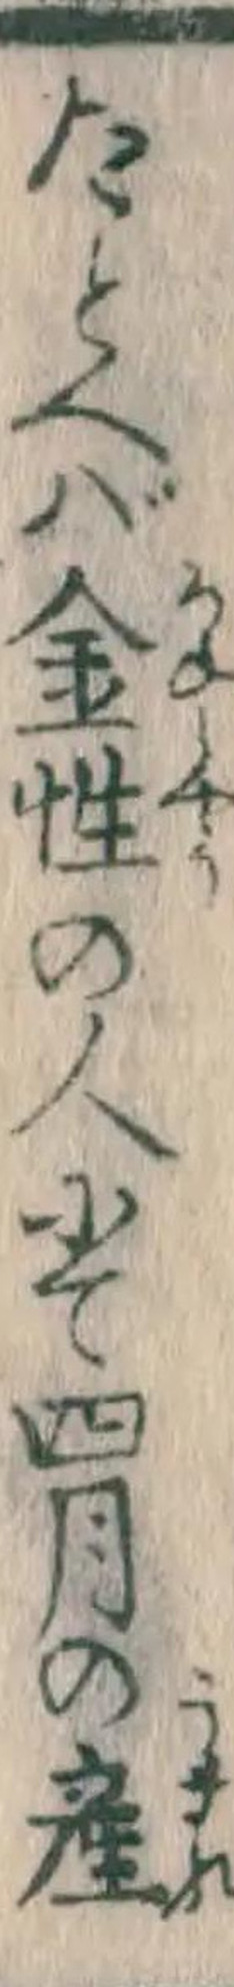たとへば金性の人にて四月の産
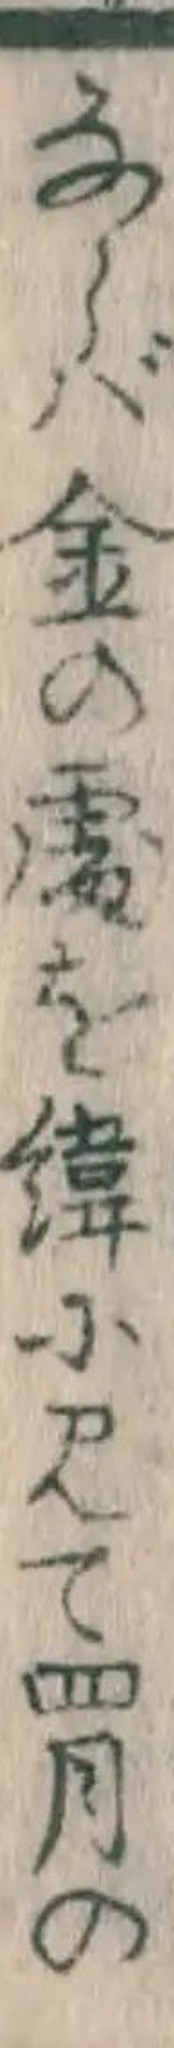ならば金の処を緯に見て四月の
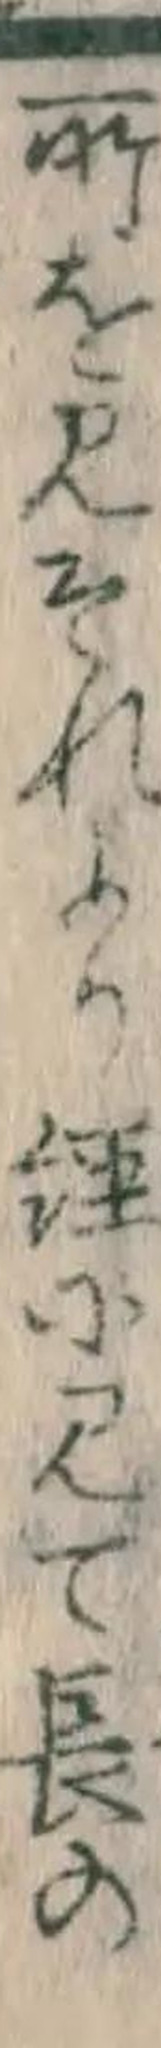所を見それより経に見て長の
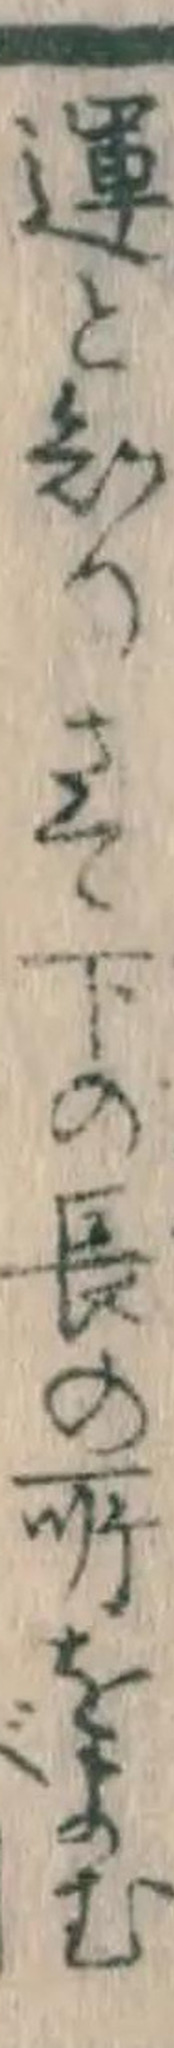運と知りさて下の長の所を読むべし

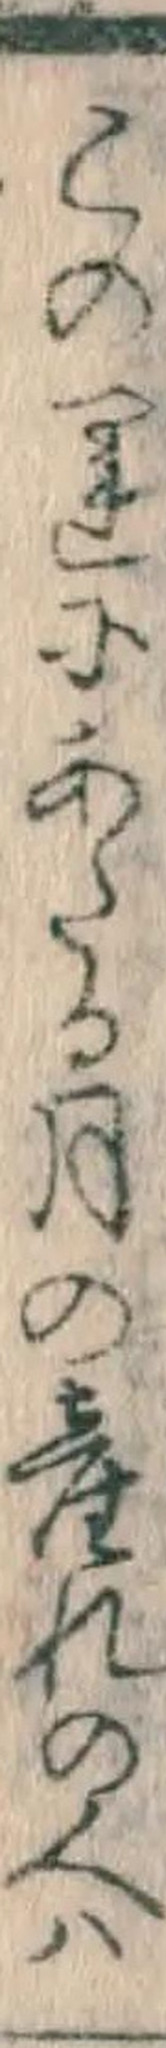この運にあたる月の産れの人は
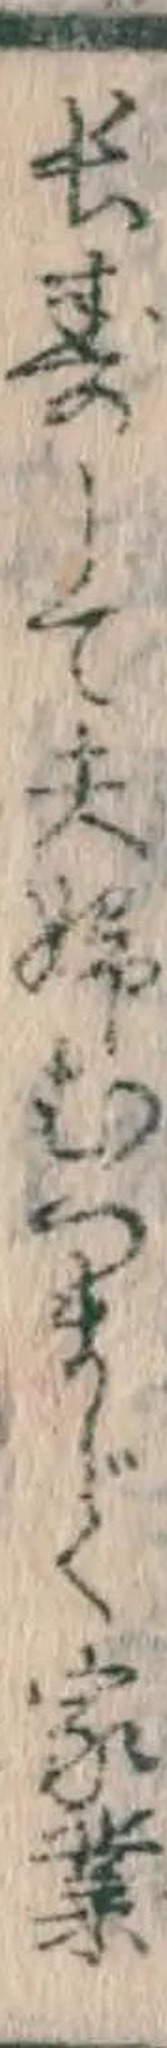長寿して夫婦むつまじく家業
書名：広益秘事大全 3巻. [2]
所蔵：国立国会図書館 National Diet Library, JAPAN
